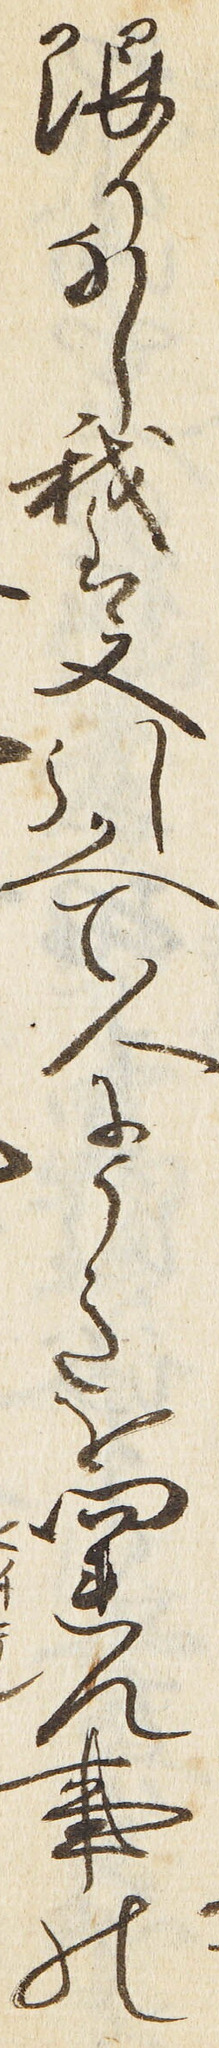限りなし我は又引かへて人にうきを問れん事の
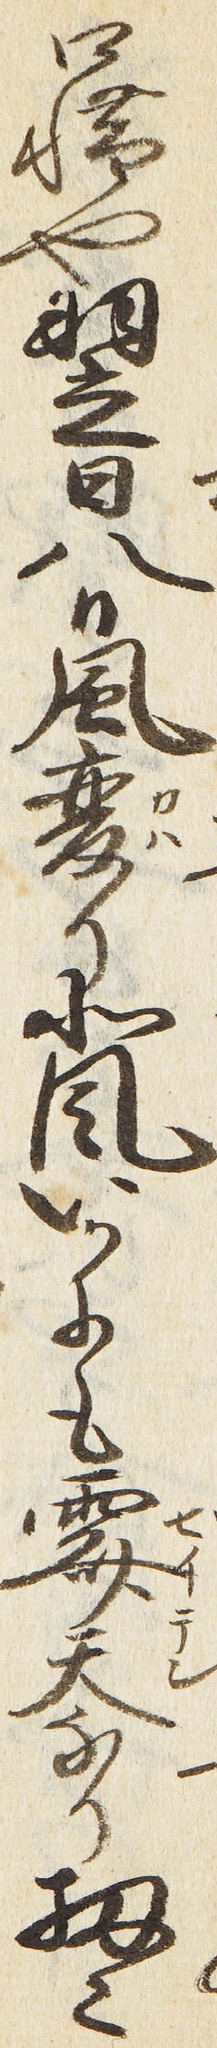口惜や翌日八日風変り北風いかにも霽天なり扨々
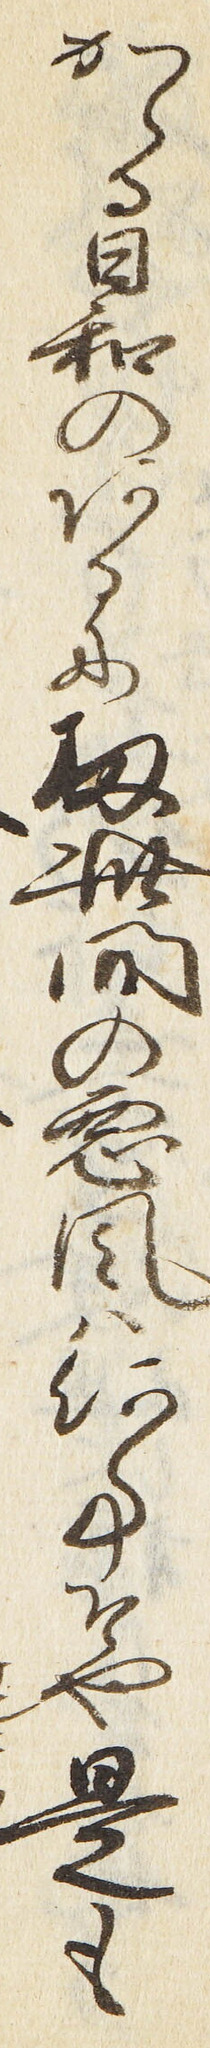かかる日和のあるに扨此間の悪風は何事そや是も
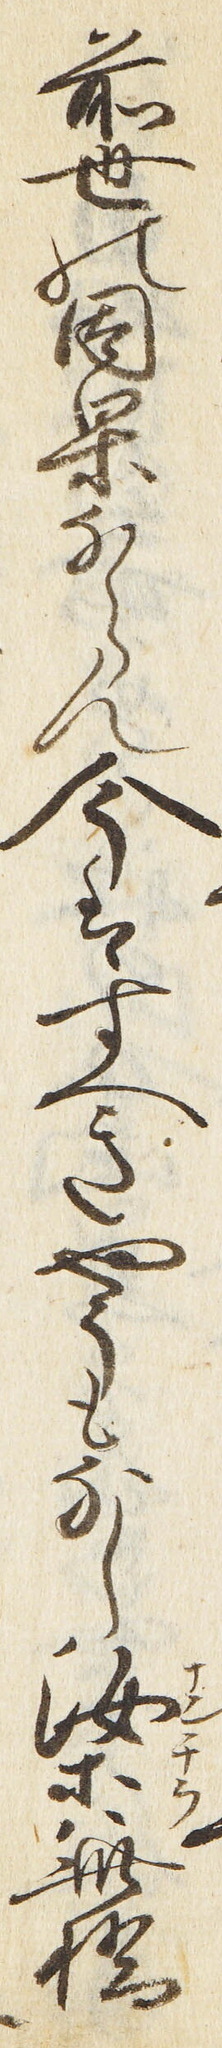前世の因果ならん今はすへきやうもなし汝等は此橋
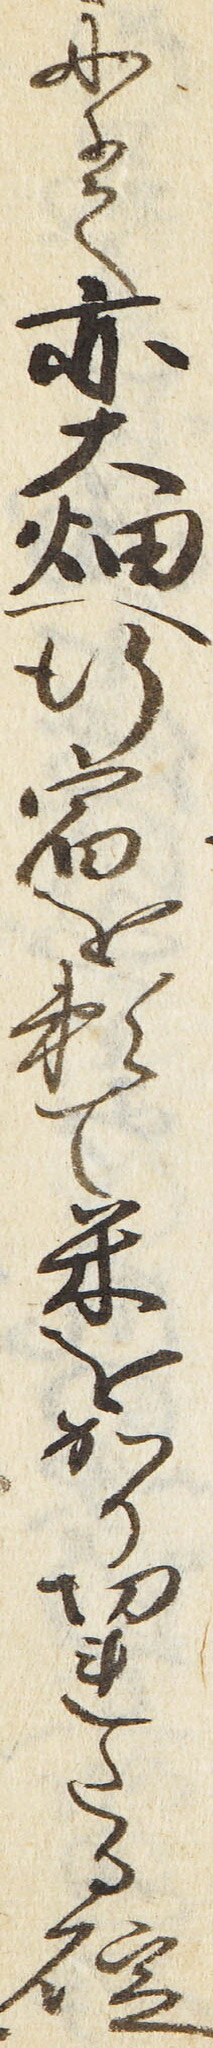舟にて亦大畑へ行宿を頼て米をかり切れたる碇
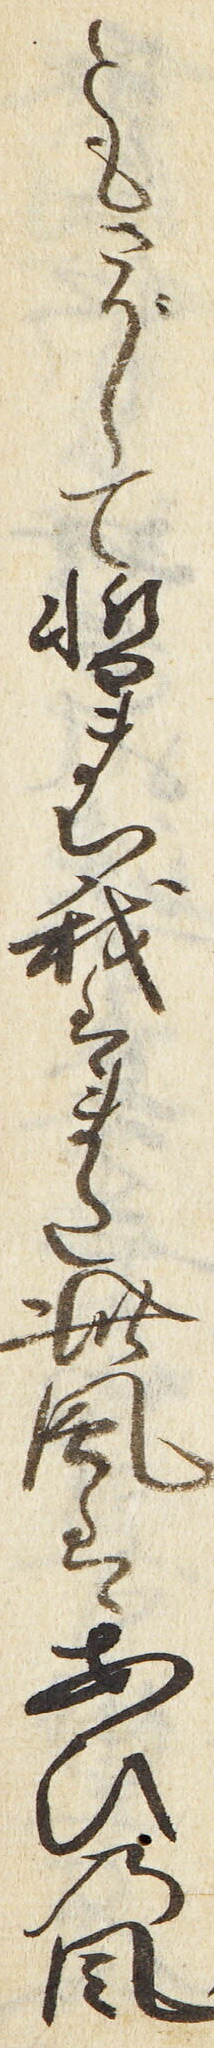ともさがして暫まち我はまた此風はあひの風

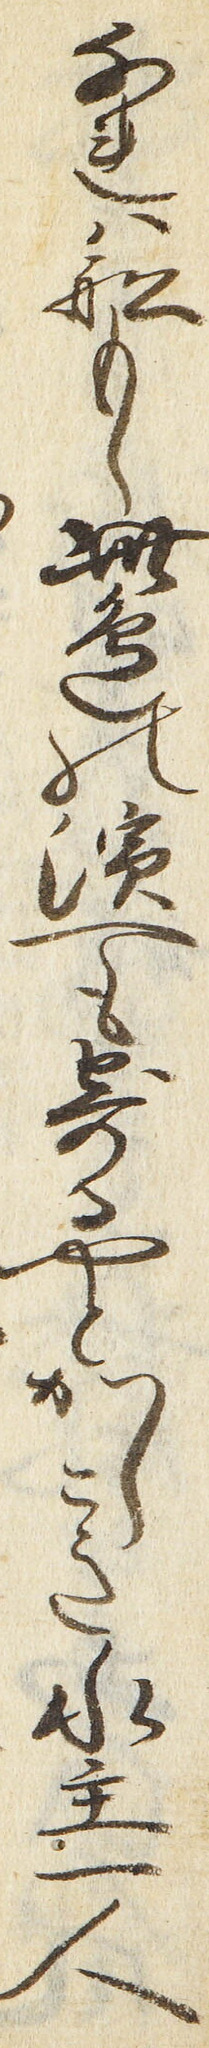なれは船もし此辺の浜へも寄るやとかしこき水主一人
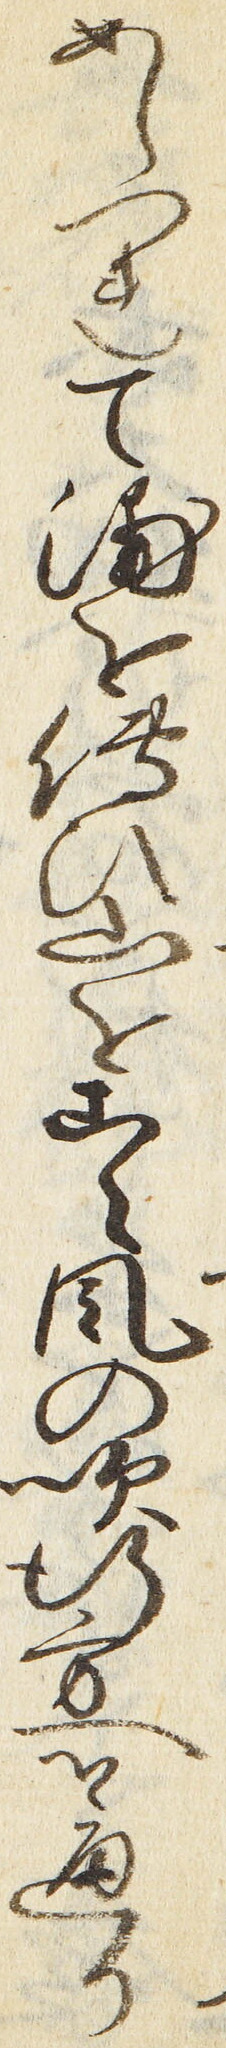めしつれて浦を伝ひ山をこし風の吹行方へそ通り
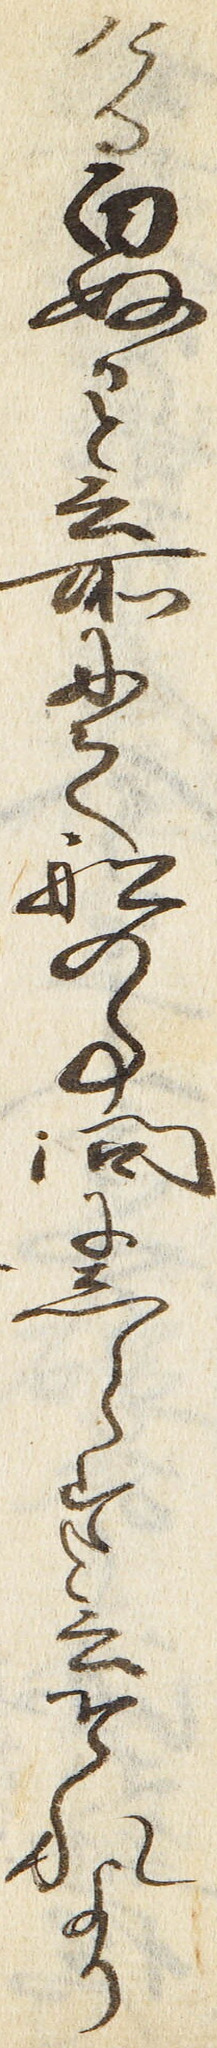ける白ぬかと云所にて船の事問にしらすと云それより
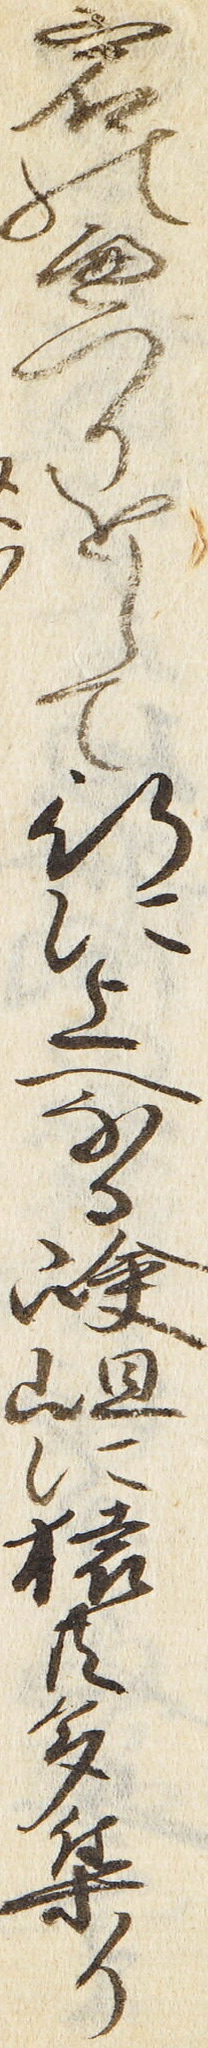岩のへつりをして行に上へなる嶮岨に猿共多集り
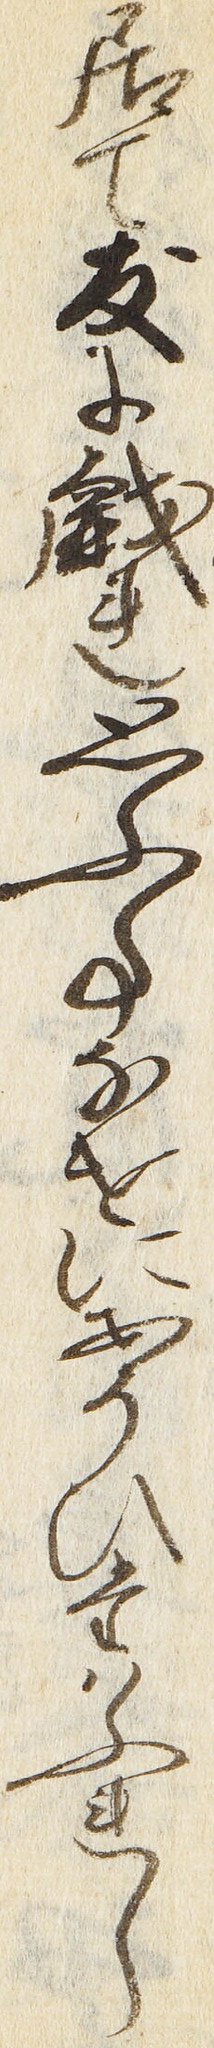居て友に戯れ思ふ事なきにあうひといふれし
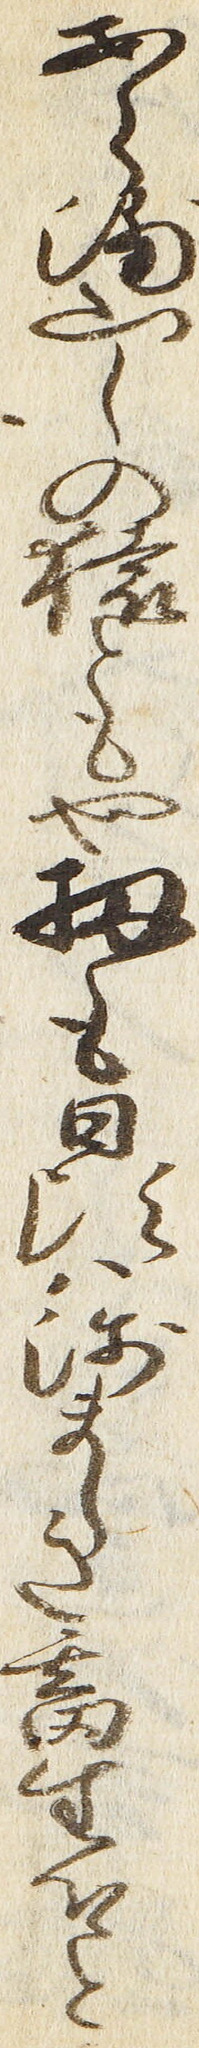あら浦山しの猿ともや扨も日頃ハ浅ましき畜生そと
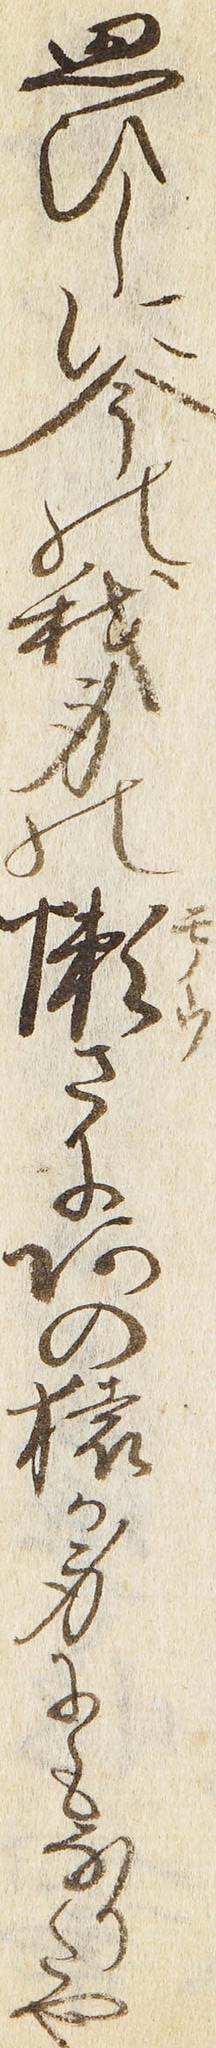思ひしに今の我身の懶さに何の猿か身にもなりたや
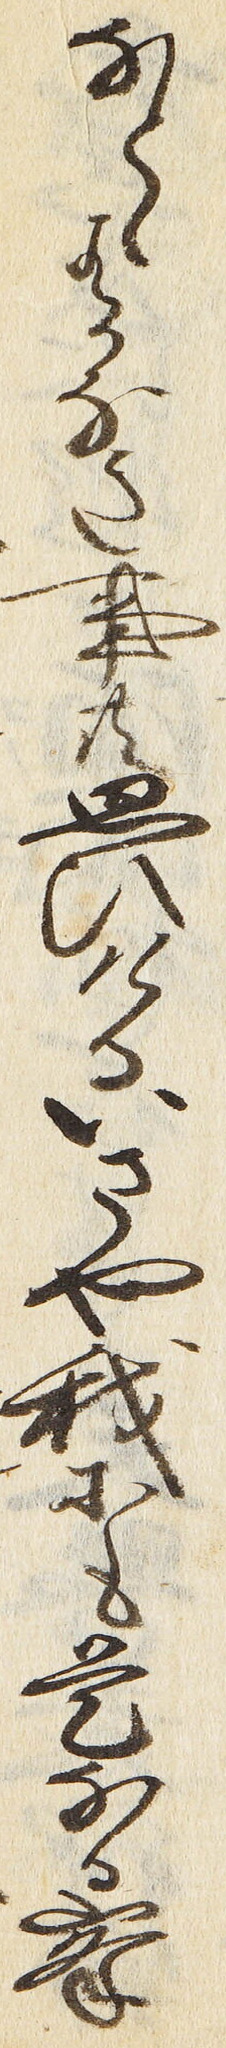なとゝはかなき事共思ひけるいさや我等も是なる峯
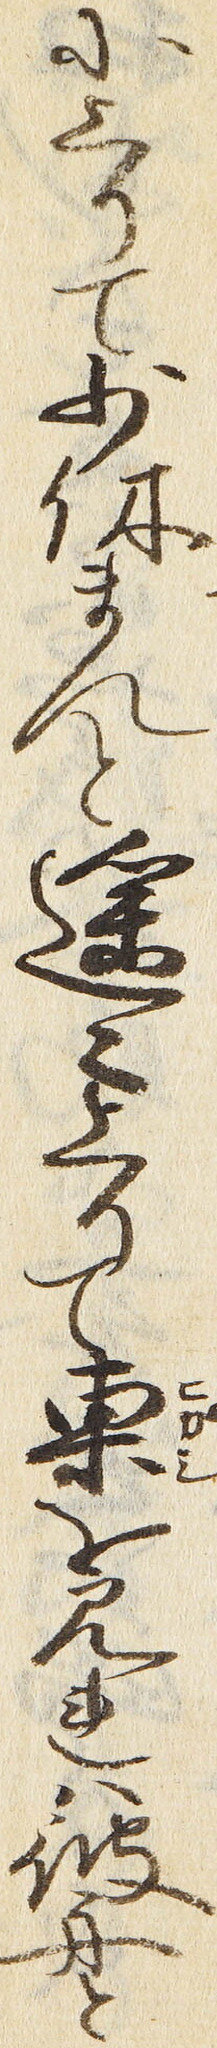に上りて少休まんと遥々上りて東を見れは彼舟と
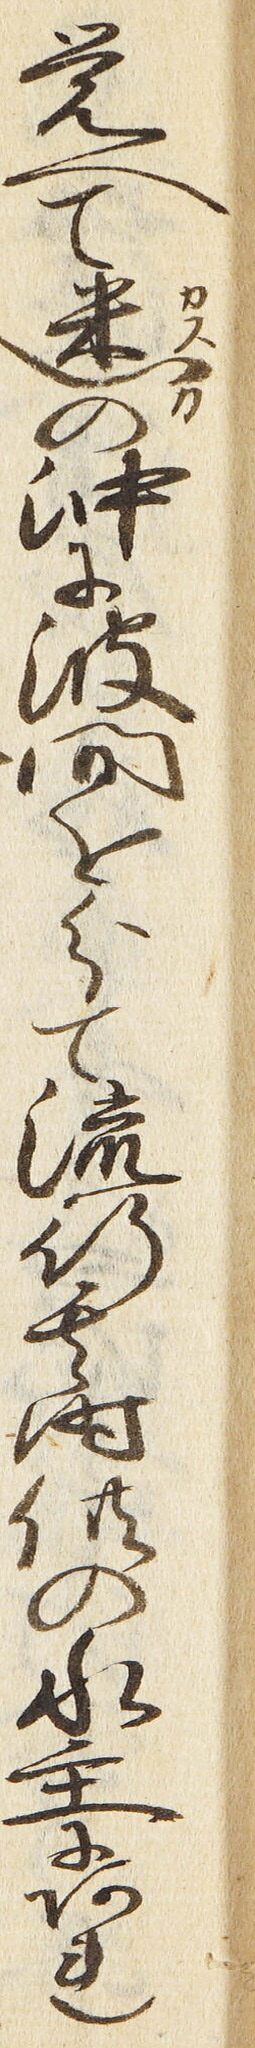覚へて幽の沖に波間を分て流行其内供の水主にあれ
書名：海陸世話日記
